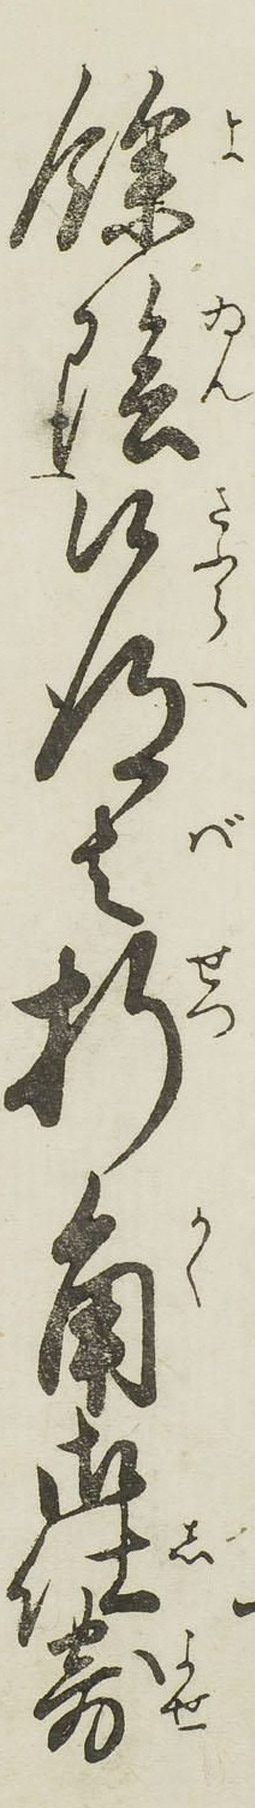余陰候得者折角御仕寄
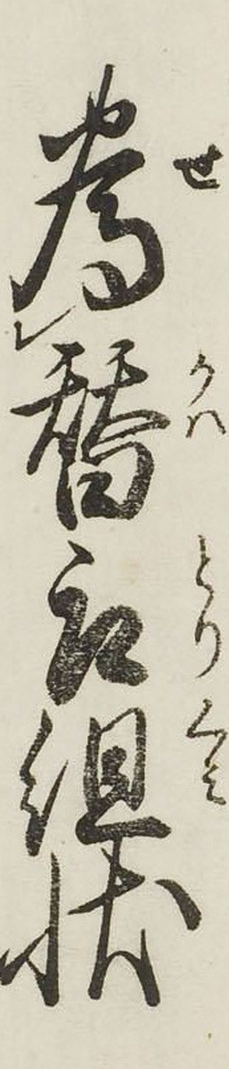為替取組状

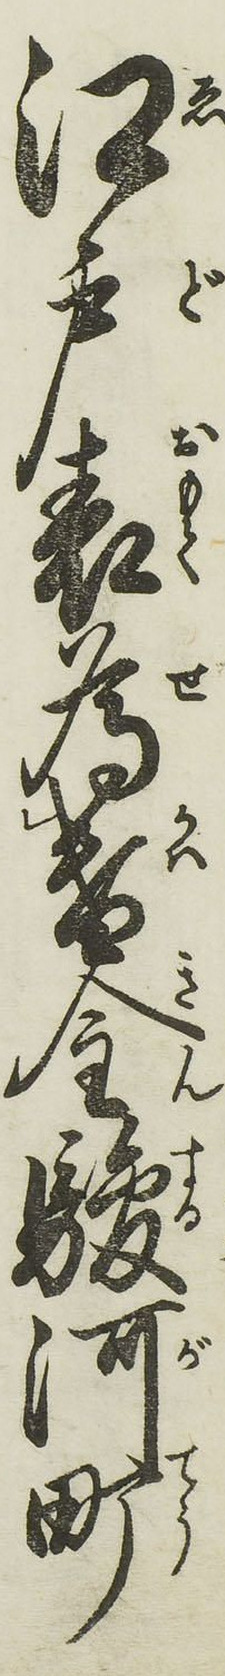江戸表為替金駿河町
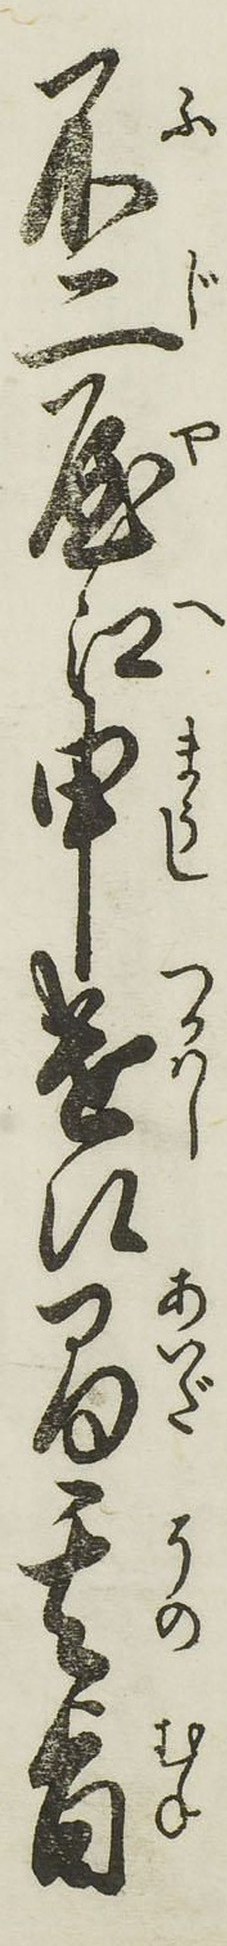不二屋江申遣候間其旨
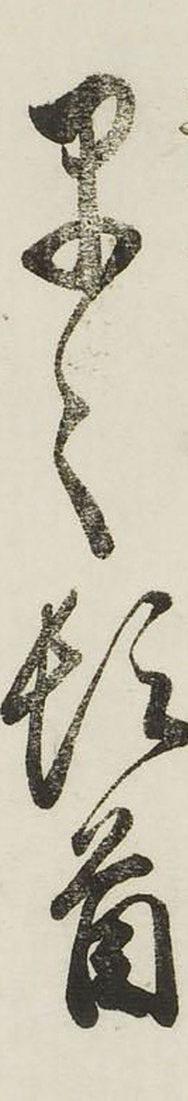早々頓首
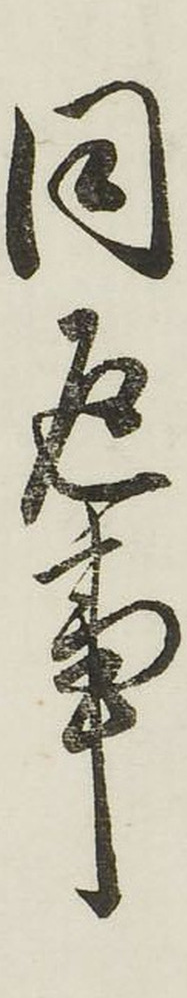同返事
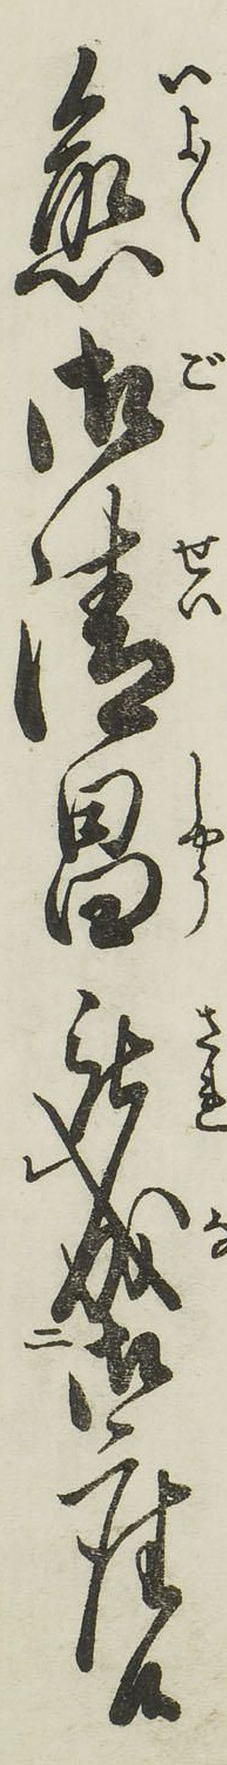愈御清昌被成御座候

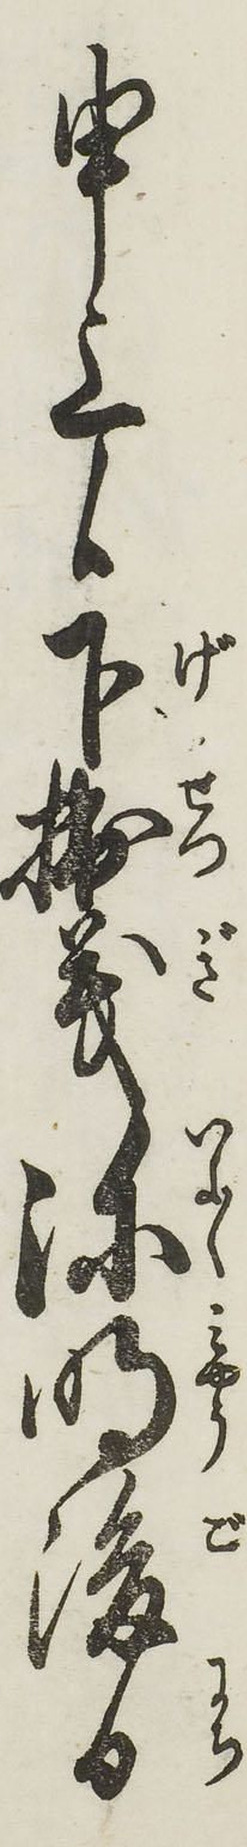申上候下拙義弥明後日
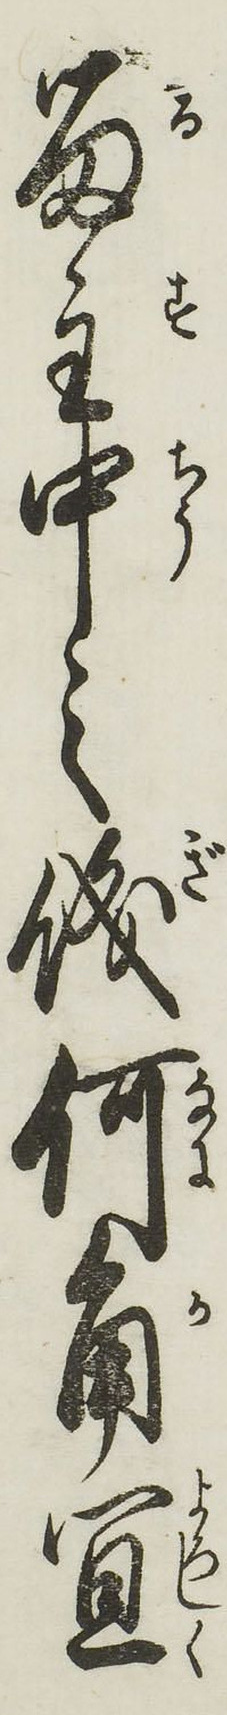留主中之儀何角宜

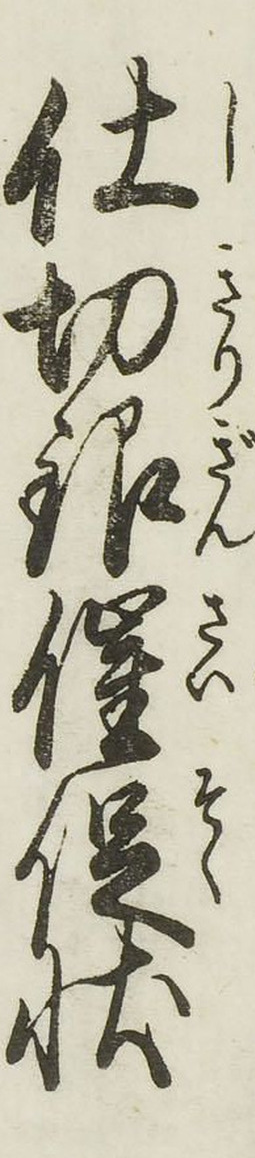仕切銀催促状
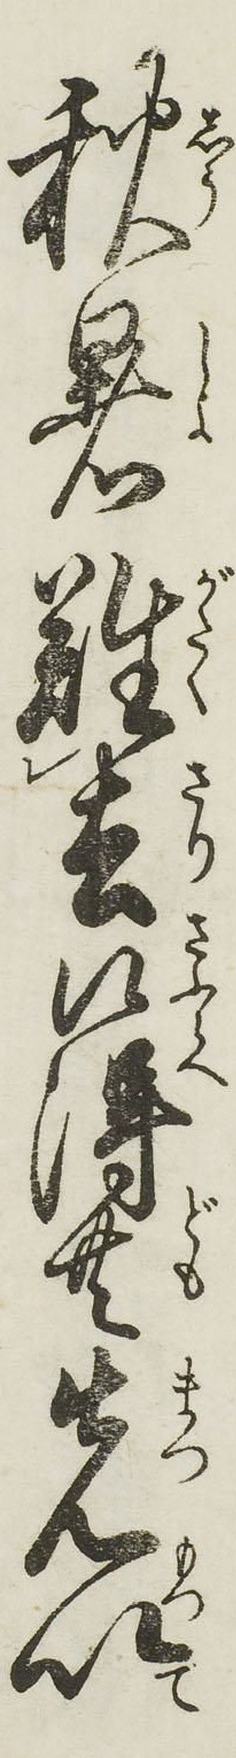秋暑難去候得共先以
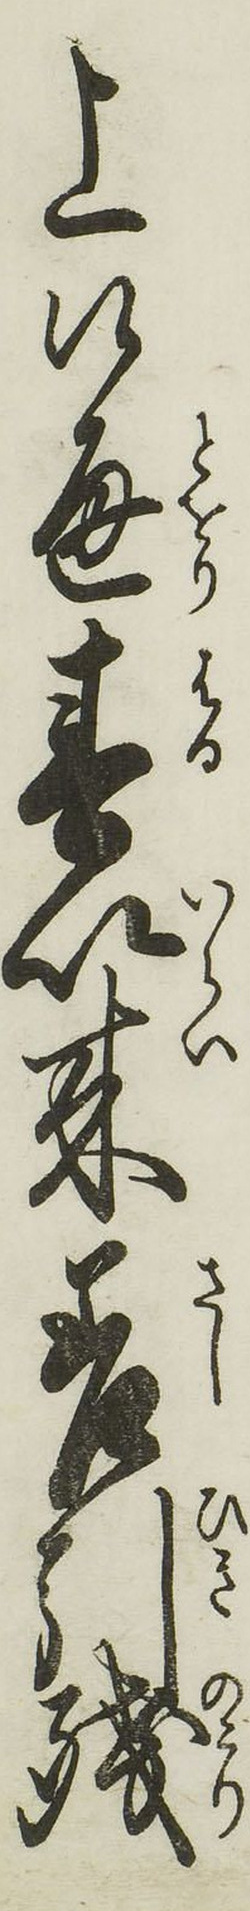上候通春以来差引残

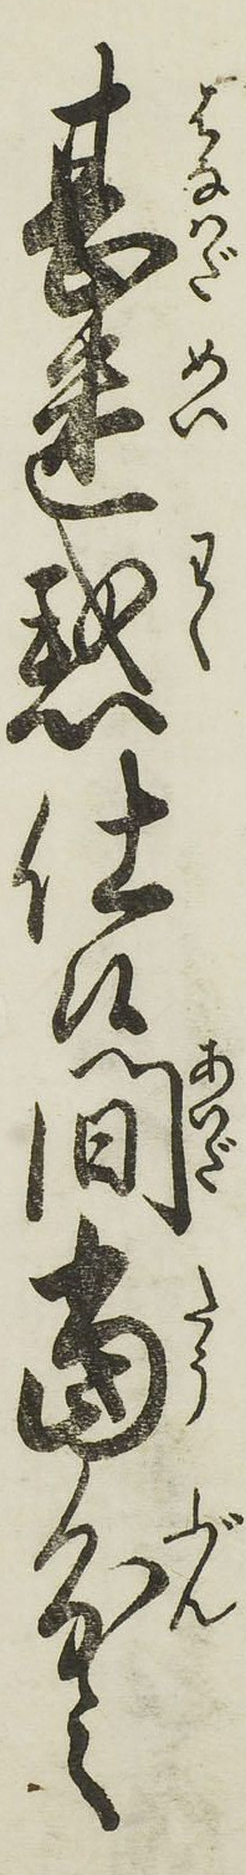甚迷惑仕候間当分之
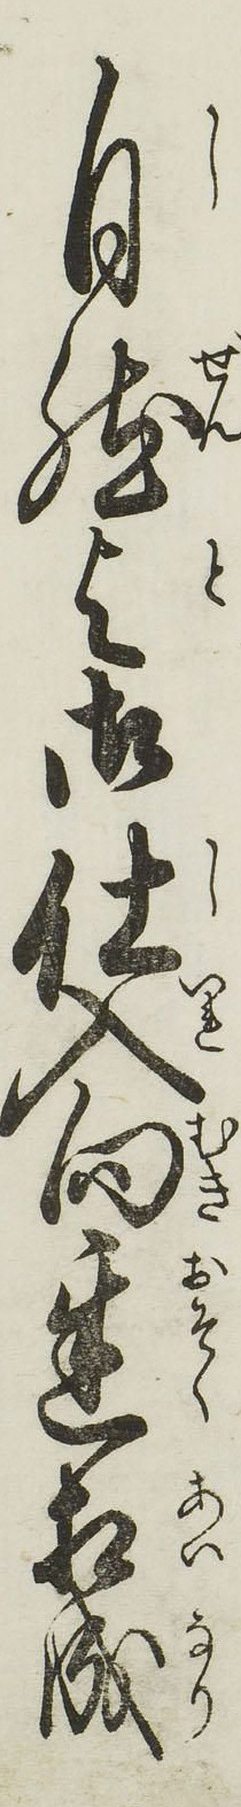自然与御仕入向遅相成

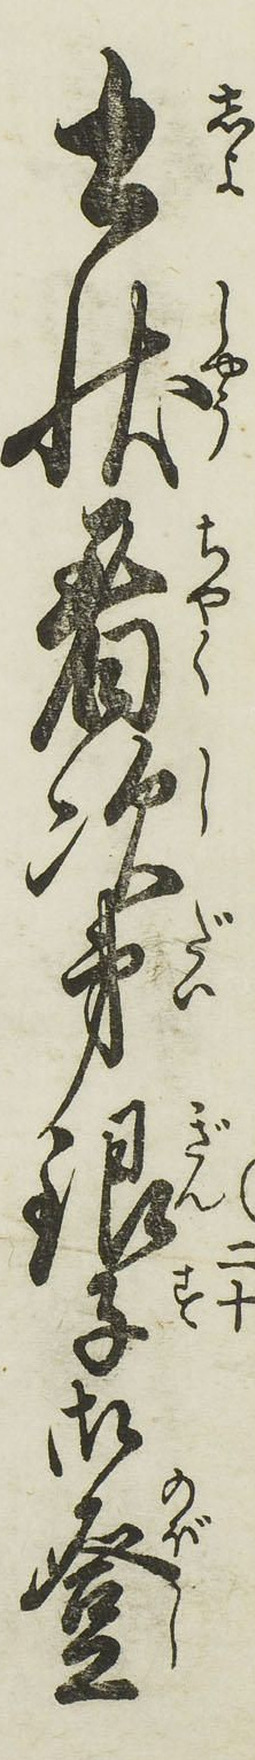書状着次第銀子御登
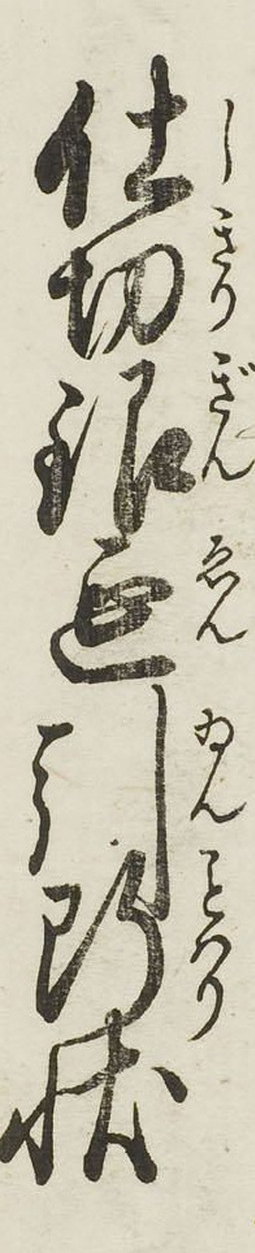仕切銀延引断状
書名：商人書翰便覧
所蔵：東京学芸大学教育コンテンツアーカイブ
